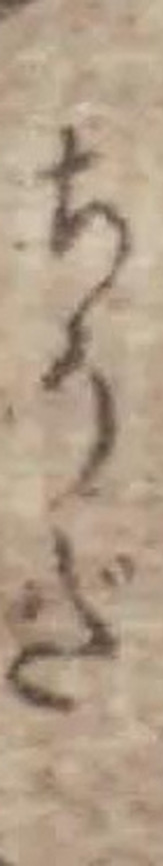ちうだ
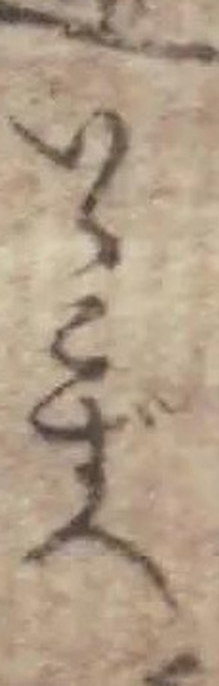いゝこずへ
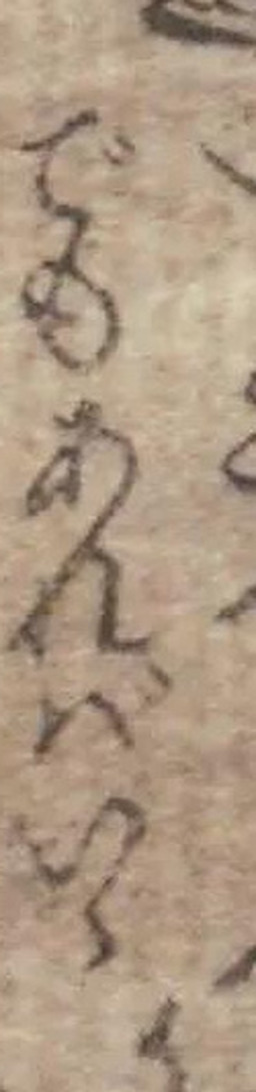でもあればいゝ
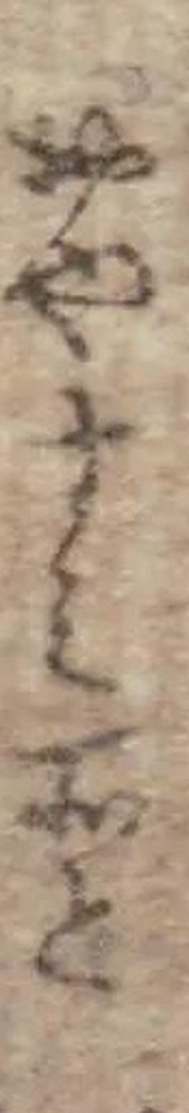おやすミ所と
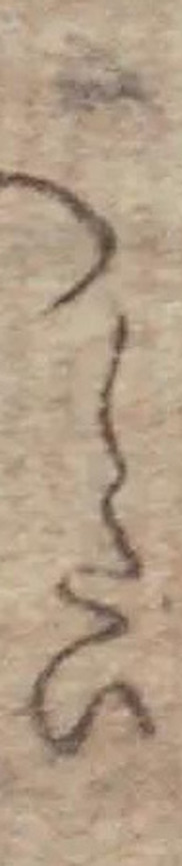したい

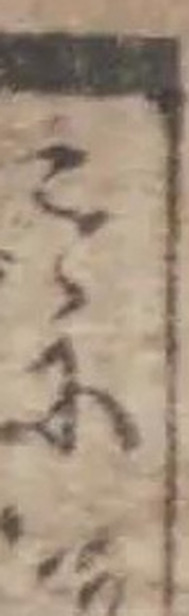こゝに
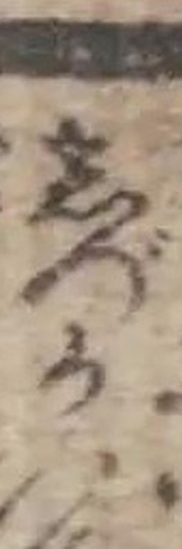しづか
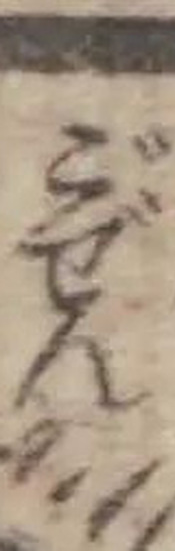ごぜん
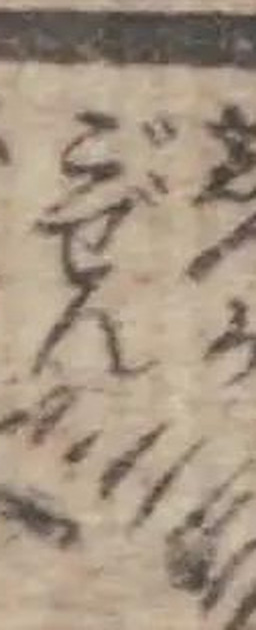ごぜん
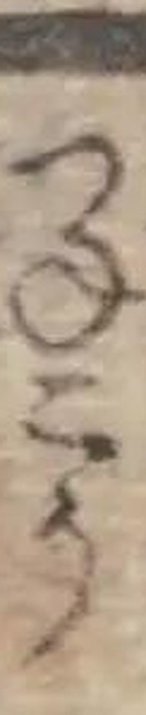つねこう
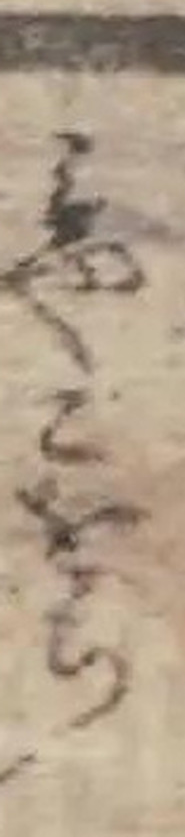ミやこをち
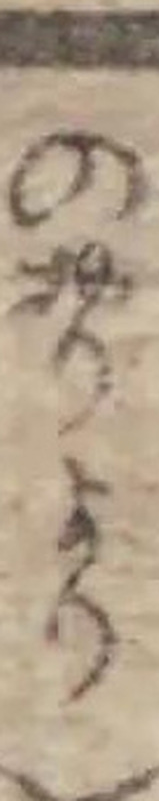のおりより
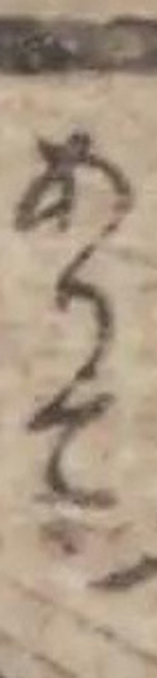ありて
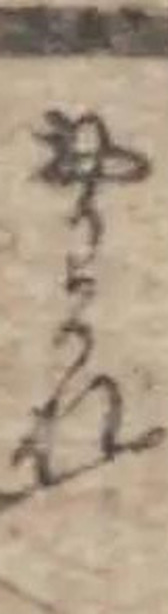おわかれ
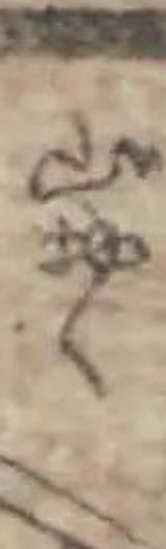山おく
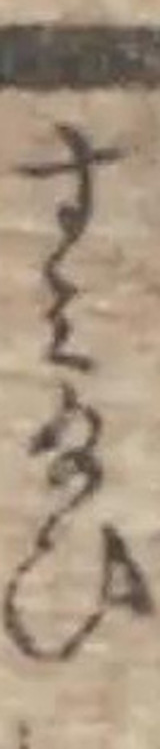すミ給ひ
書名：草紙の曙 3巻
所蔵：国立国会図書館 National Diet Library, JAPAN
